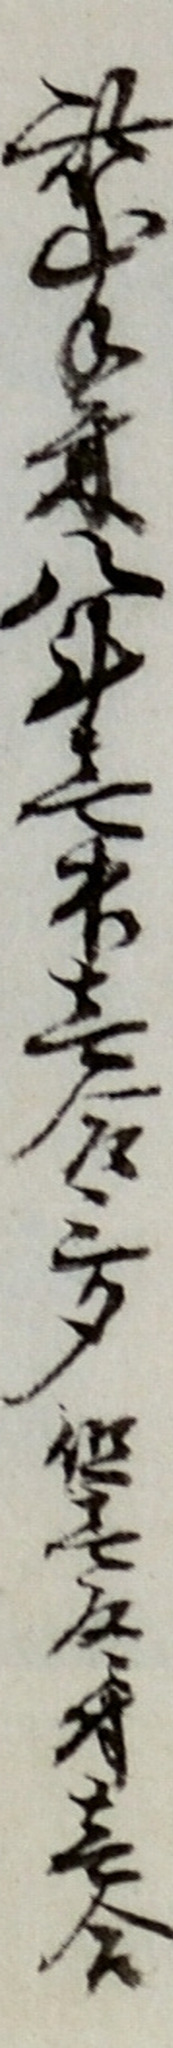此山手米八斗壱升壱合三勺但壱反ニ付壱合
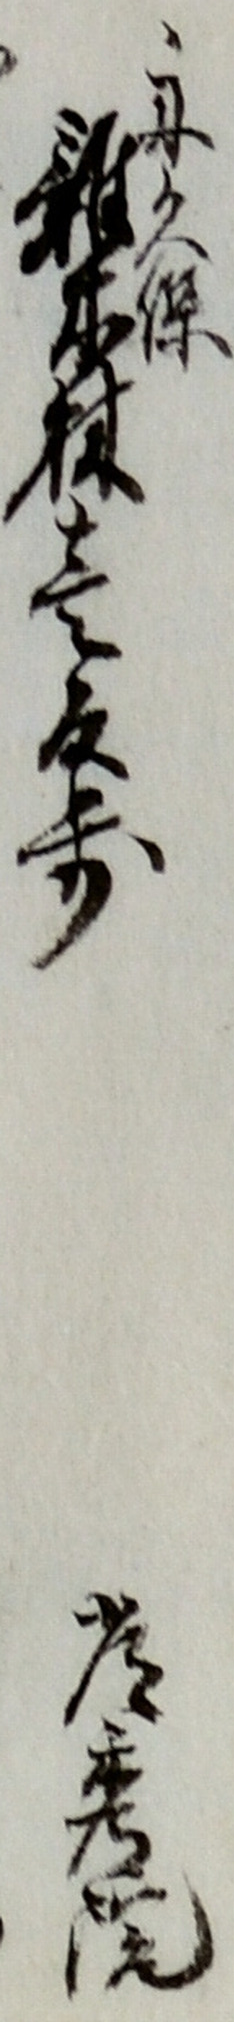雑木林壱反歩常秀院
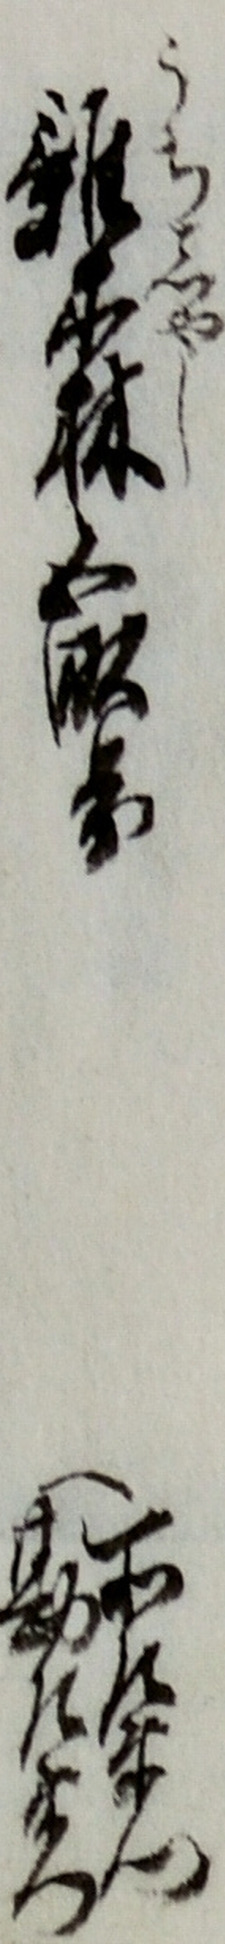雑木林壱反歩又左衛門

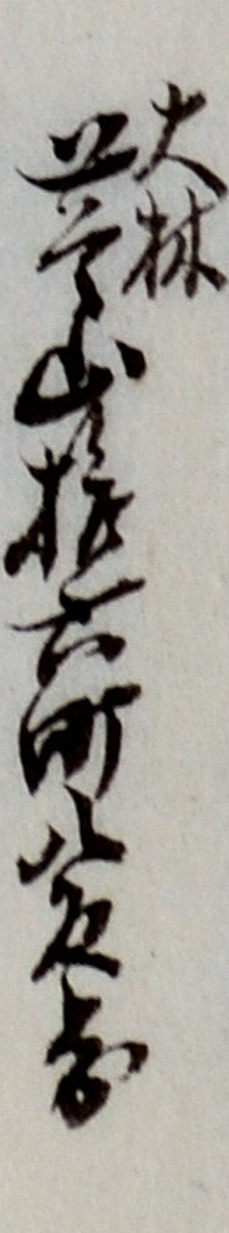芝山拾六町八反歩同人

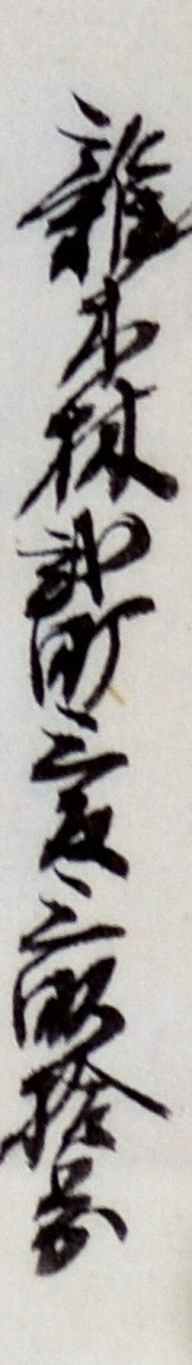雑木林弐町三反三畝拾歩吉兵衛
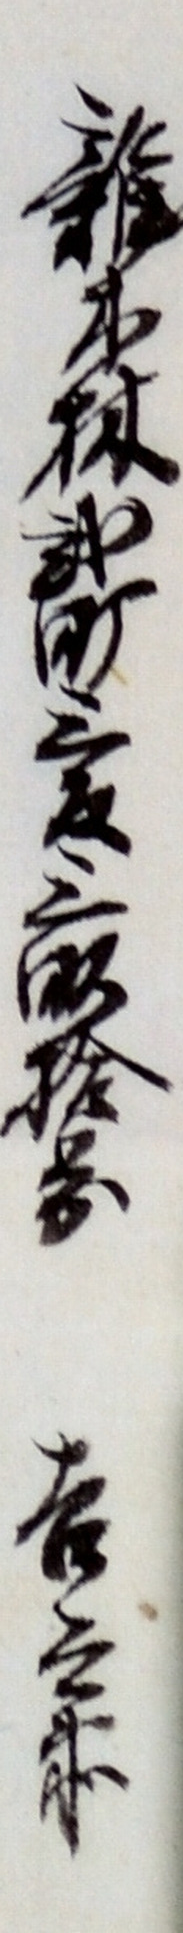雑木林弐町三反三畝拾歩吉兵衛
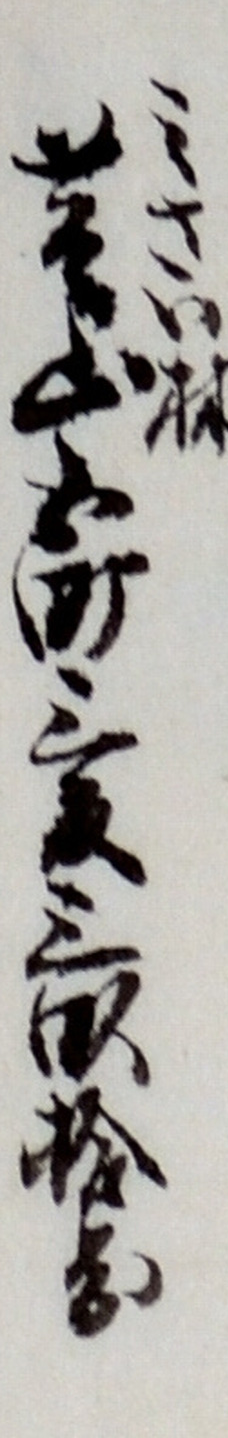芝山五町三反三畝拾歩村中
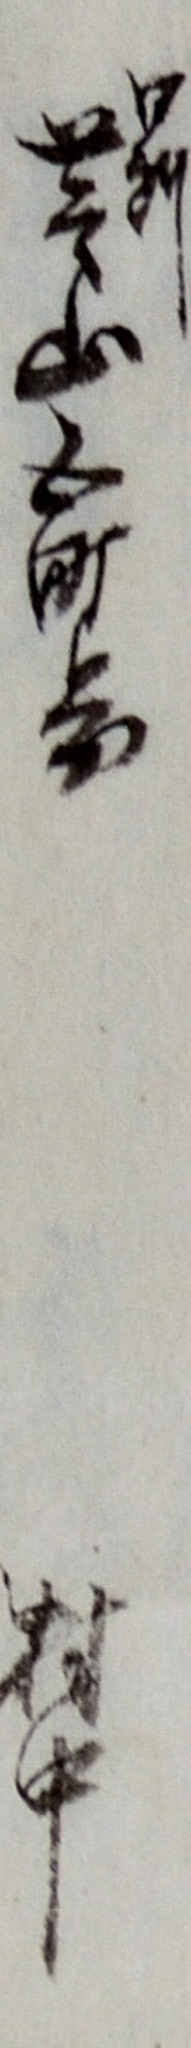芝山五町歩村中

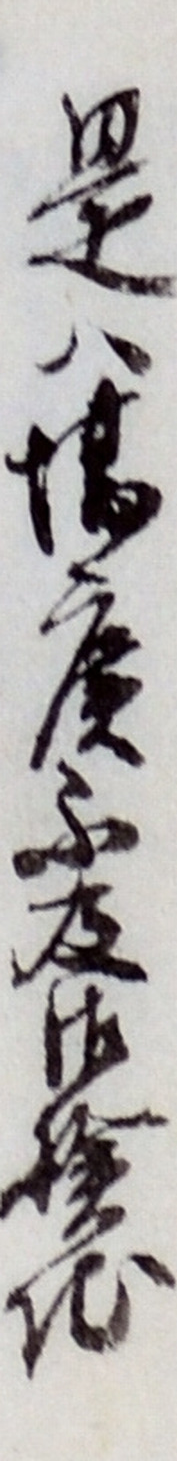是ハ場広不及御検地
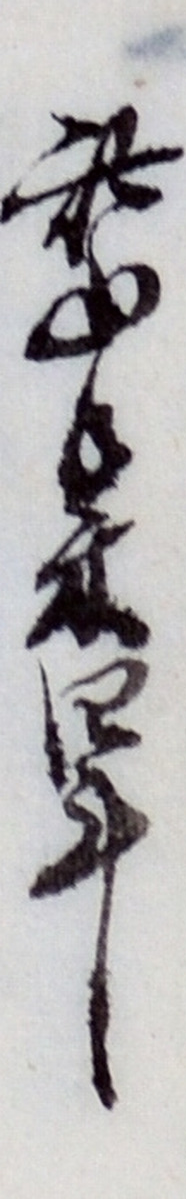此山手米四斗
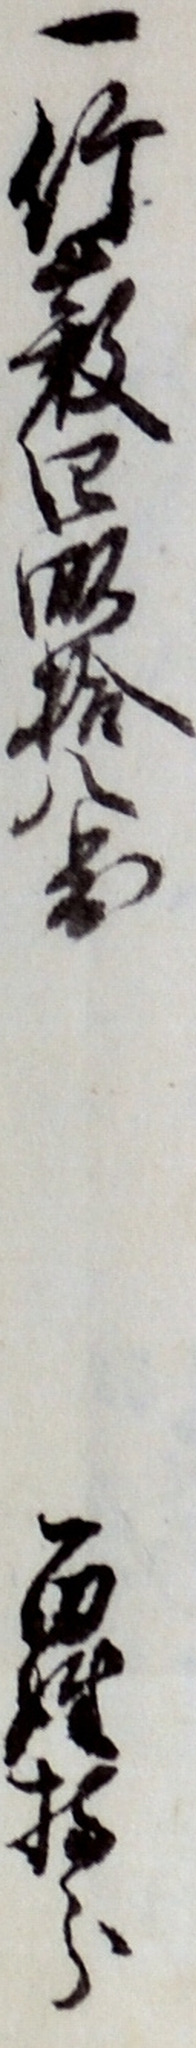一竹藪四畝拾八歩百姓持分
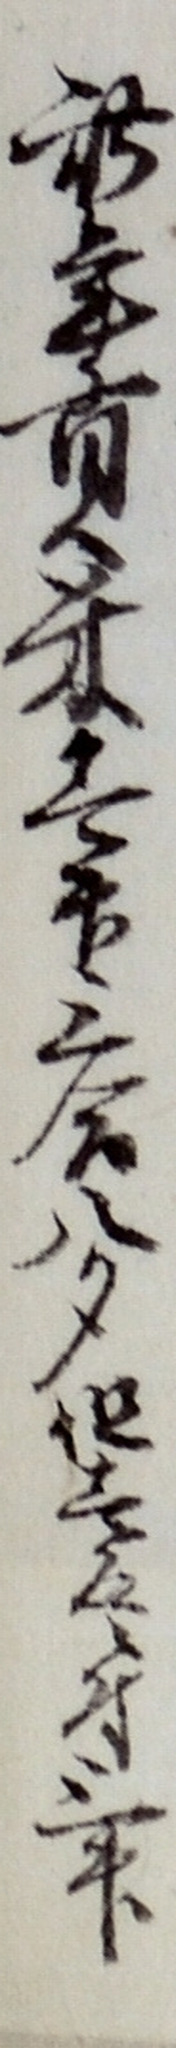此年貢米壱升三合八勺但壱反ニ付三升
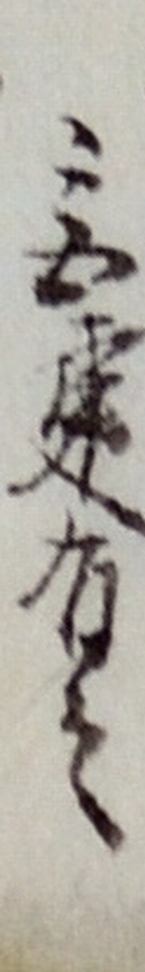宮建有之
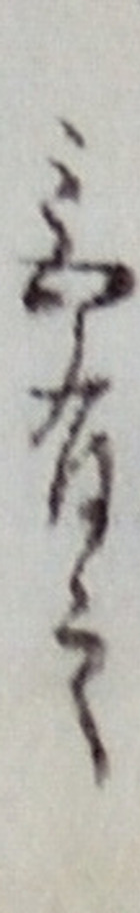宮有之
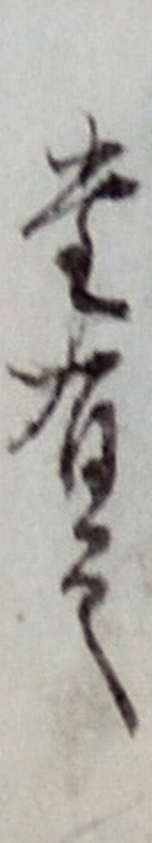宮有之

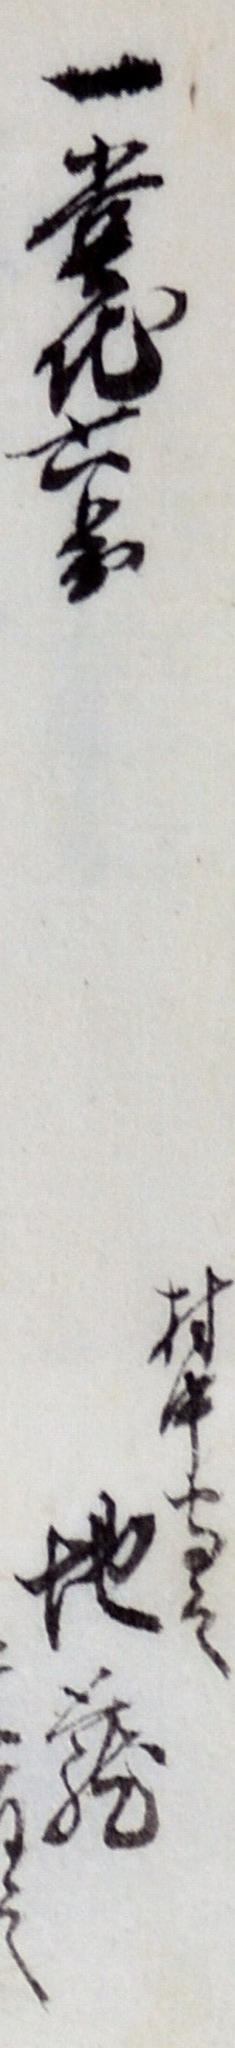一堂地六歩地蔵
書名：御領分中山林社地手控
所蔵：伊那市立高遠町図書館・合同会社AMANE
